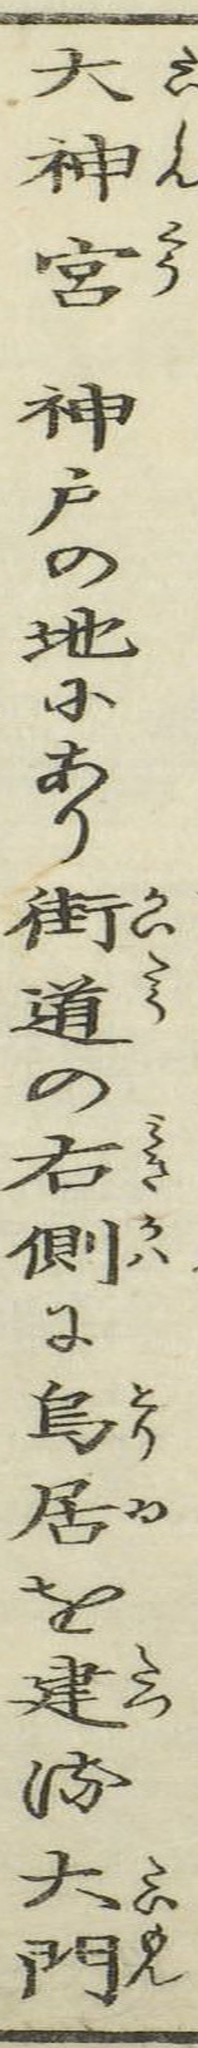大神宮神戸の地にあり街道の右側に鳥居を建る大門
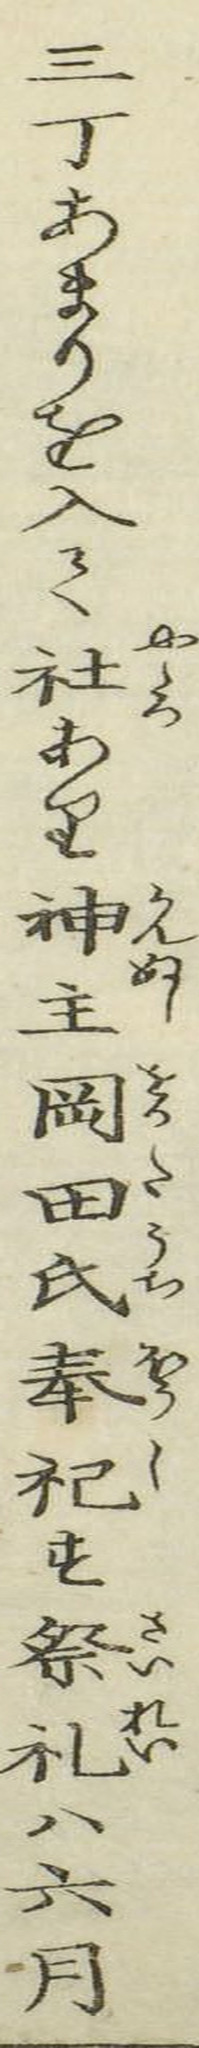三丁あまりを入て社あり神主岡田氏奉祀す祭礼は六月
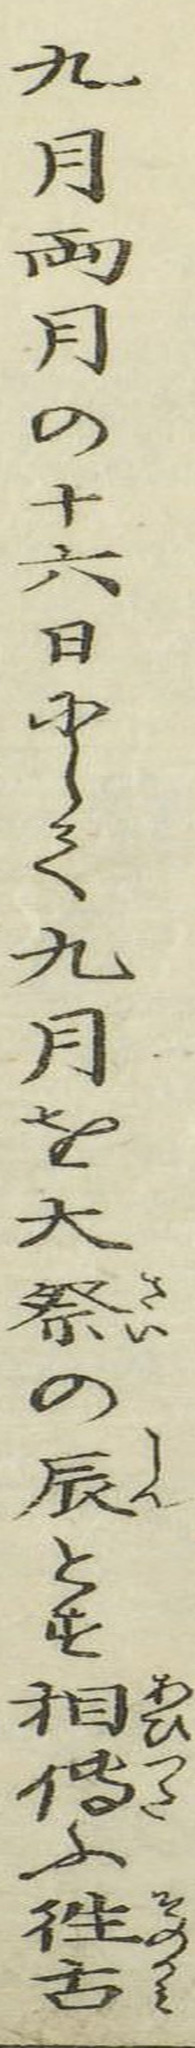九月両月の十六日にして九月を大祭の辰とす相傳ふ往古
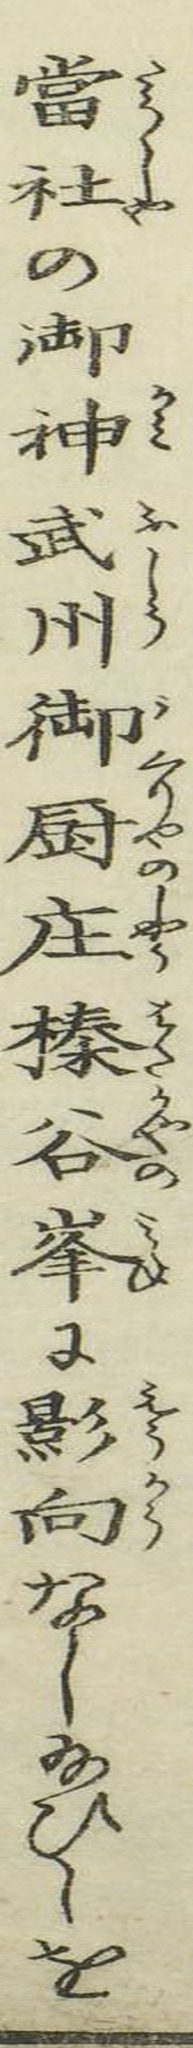當社の御神武州御厨庄榛谷峯に影向なし給ひしを
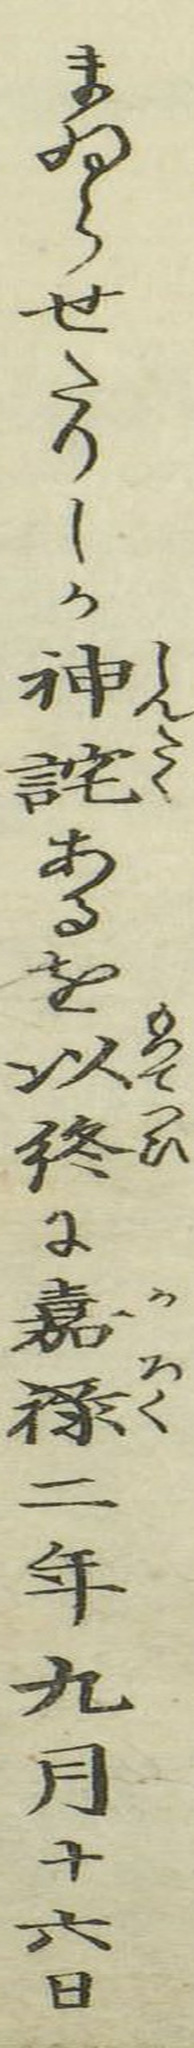まゐらせたりしか神詫あるを以終に嘉禄二年九月十六日

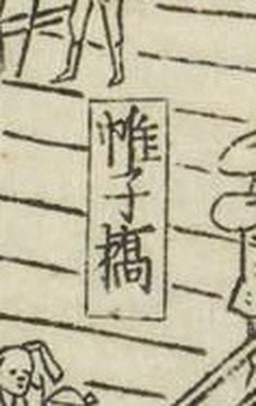帷子橋
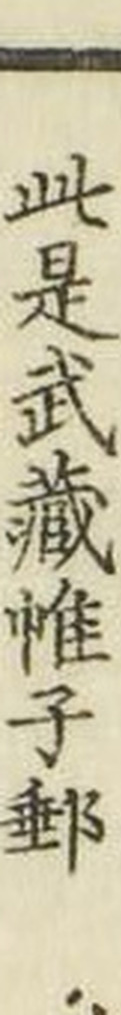此是武藏帷子郵
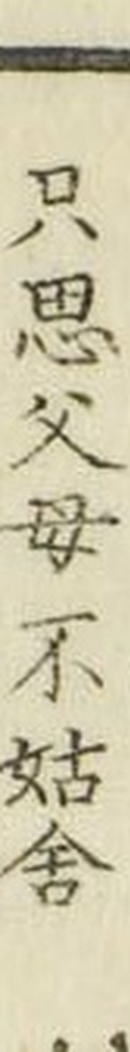只思父母不姑舎
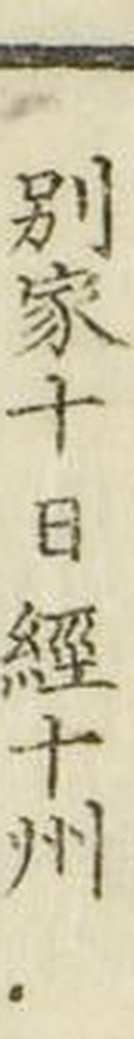別家十日經十州
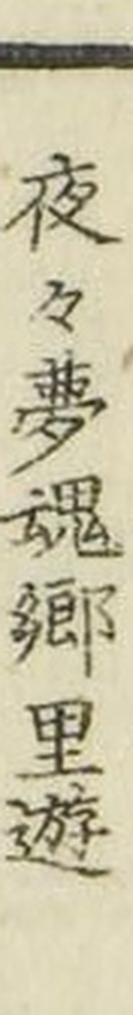夜々夢魂郷里遊

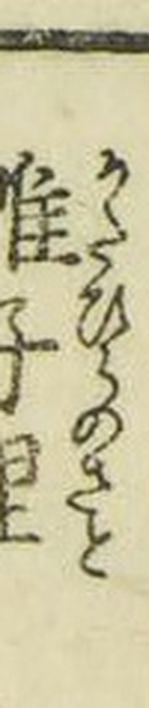帷子里
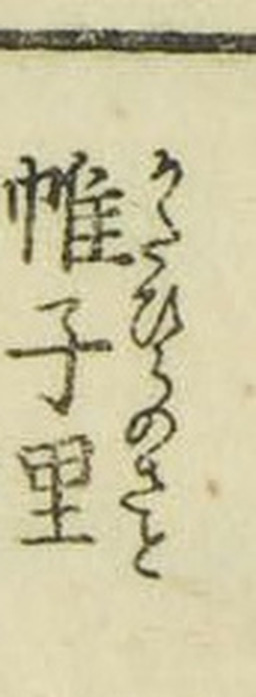帷子里
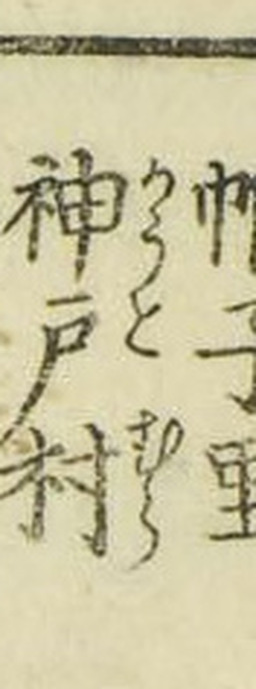神戸村
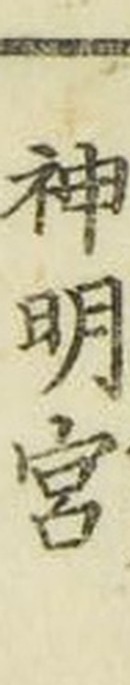神明宮
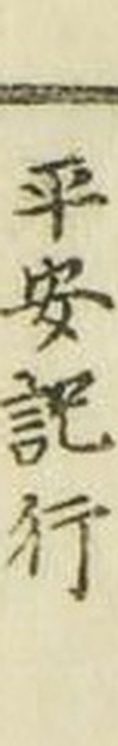平安記行
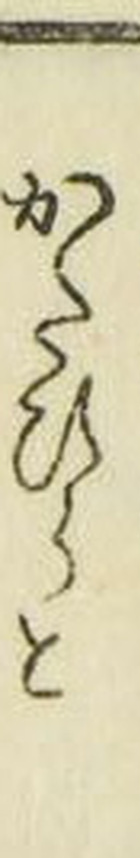かたひらと
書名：江戸名所図会 20巻 巻之6
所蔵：東京学芸大学教育コンテンツアーカイブ
